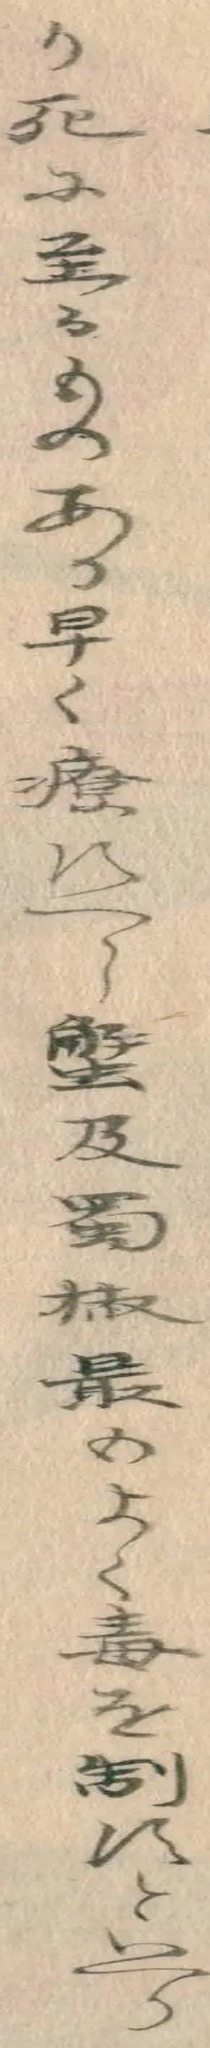り死に至るものあり早く療すへし蟹及蜀椒最のよく毒を制すといへり
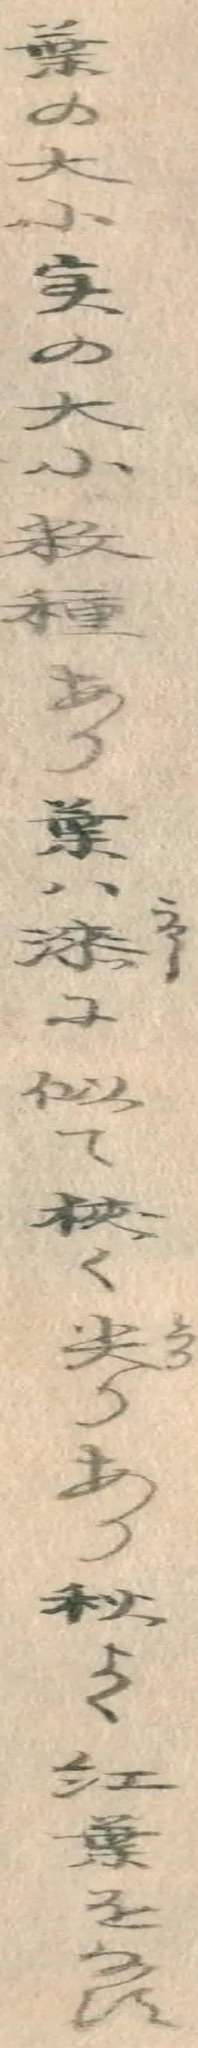葉の大小実の大小数種あり葉は漆に似て狭く尖りあり秋よく紅葉をなす
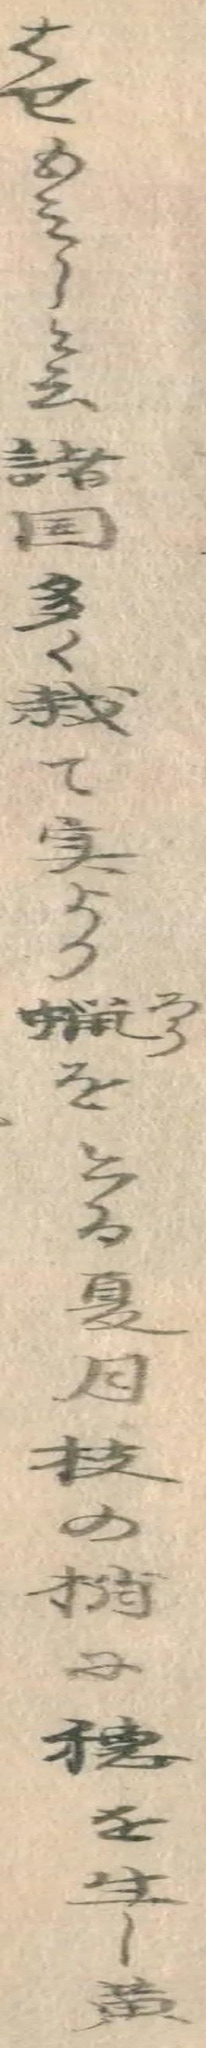はせもみしと云諸国多く栽て実より蠟をとる夏月枝の梢に穂を生し黄
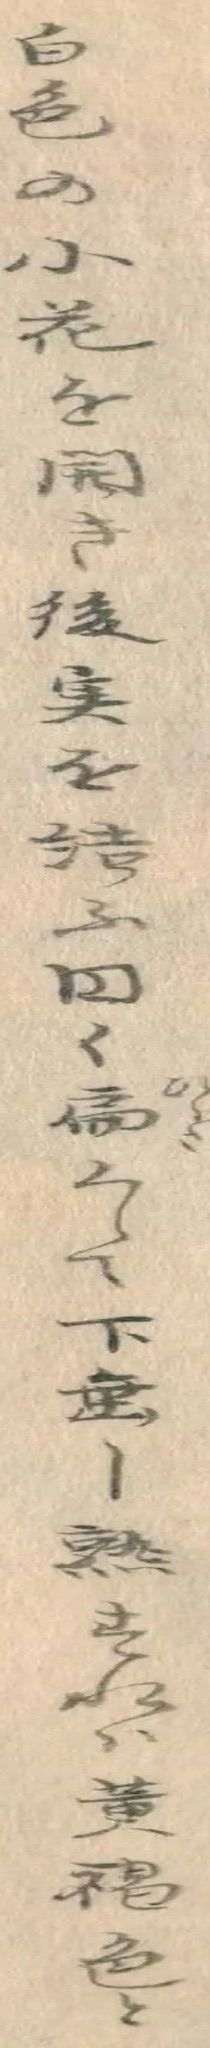白色の小花を開き後実を結ふ円く扁くして下垂し熟すれは黄褐色と

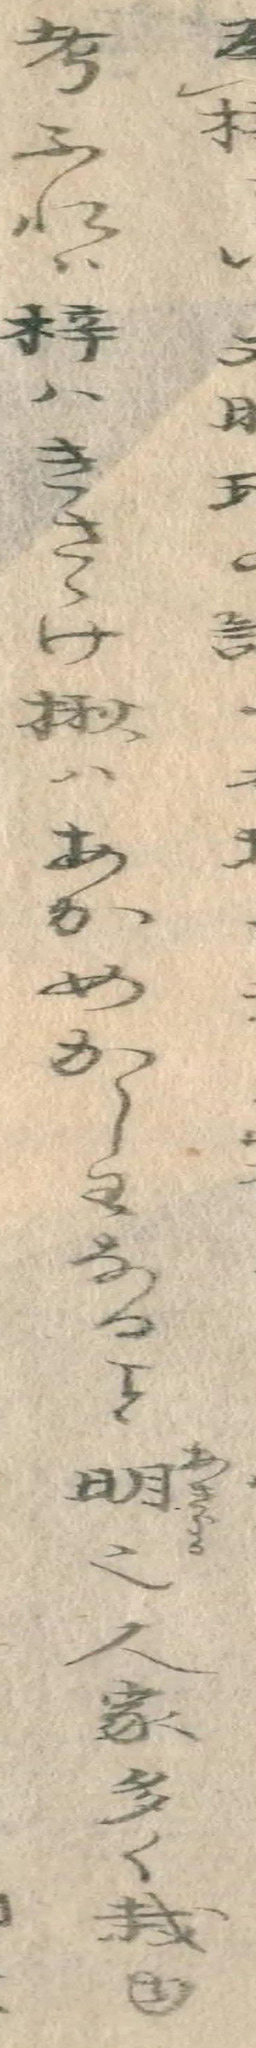考ふれは梓はきさゝけ楸はあかめかしわなること明也人家多く栽ゆ
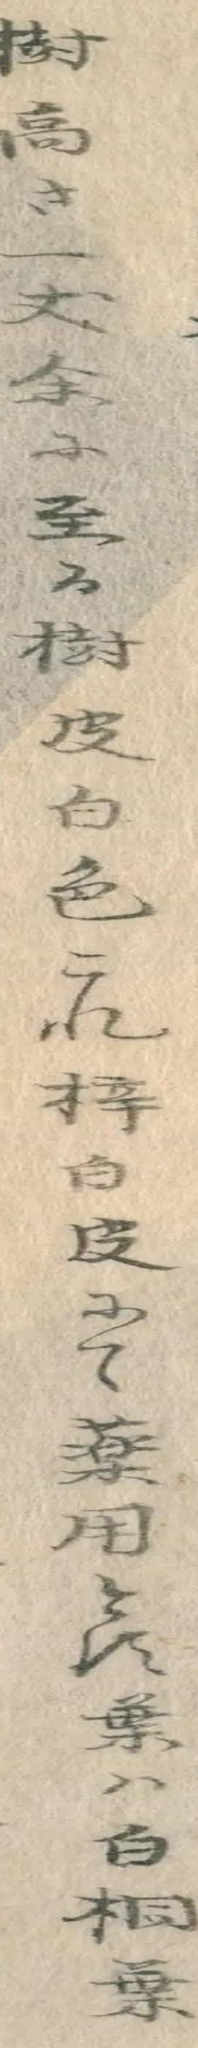樹高さ一丈余に至る樹皮白色これ梓白皮にて薬用とす葉は白桐葉
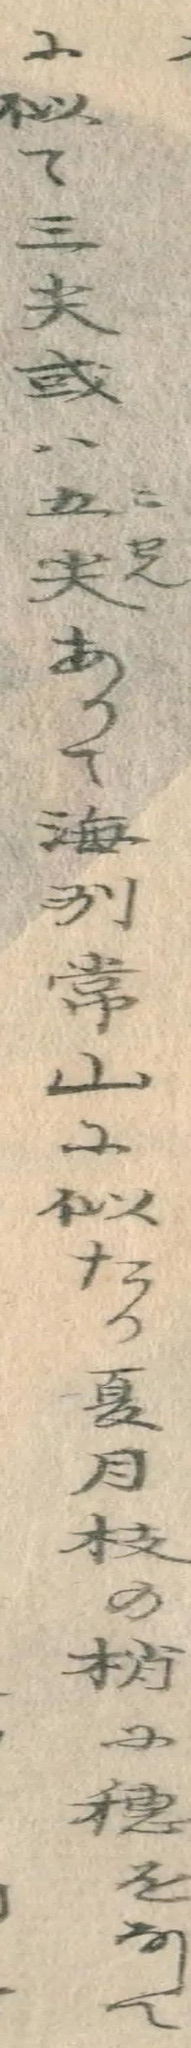に似て三尖或は五尖ありて海州常山に似たり夏月枝の梢に穂をなして
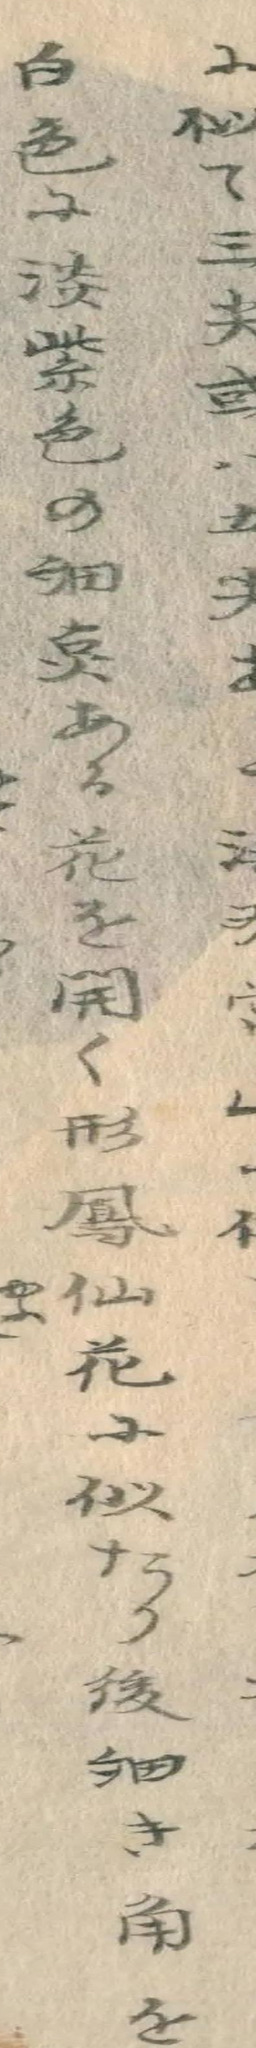白色に淡紫色の細点ある花を開く形鳳仙花に似たり後細き角を
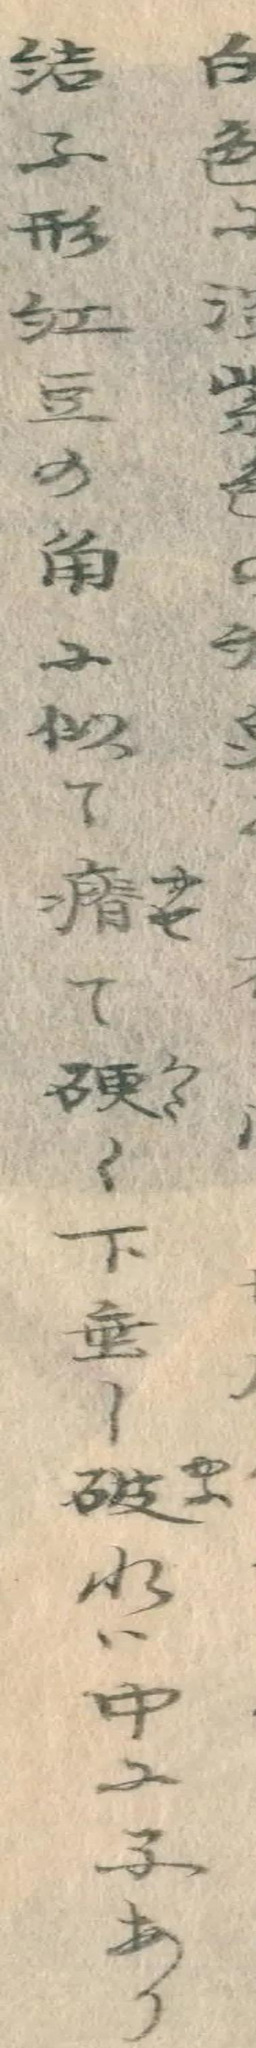結ふ形紅豆の角に似て瘠て硬く下垂し破れは中に子あり
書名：本草図譜. 巻82-84
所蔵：国立国会図書館 National Diet Library, JAPAN
